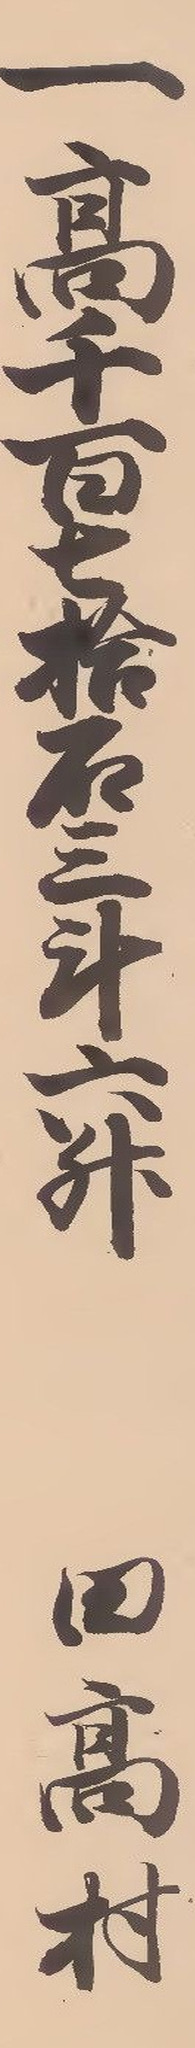一高千百七拾石三斗六升田高村
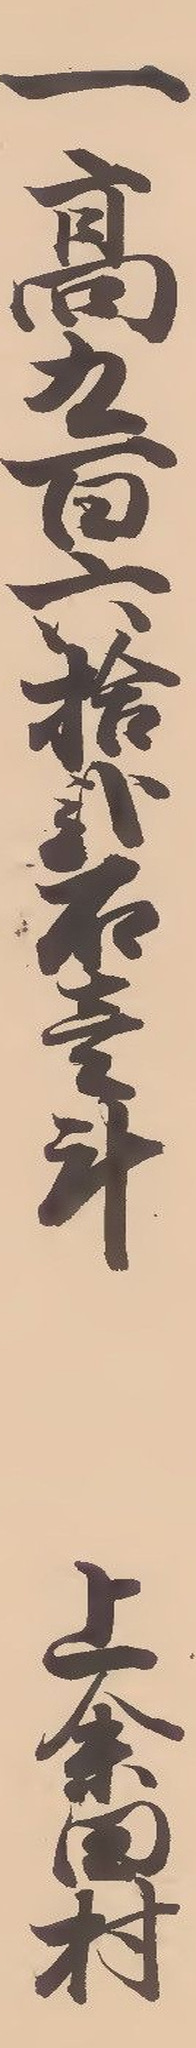一高九百六拾弐石壱斗上余田村
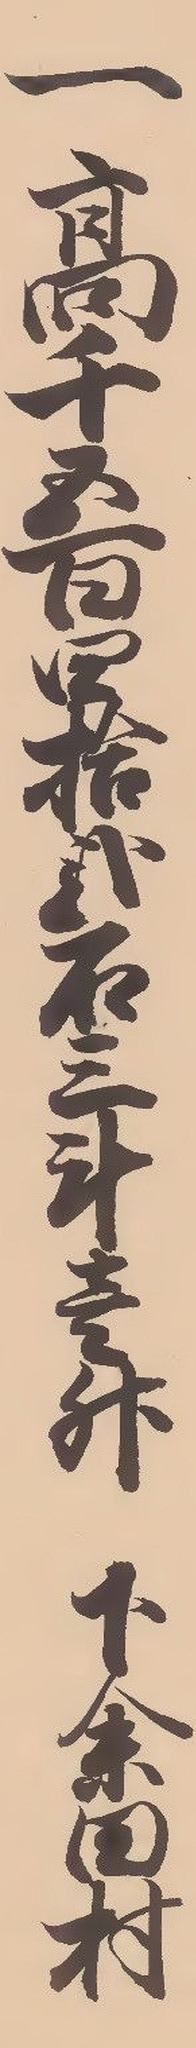一高千五百四拾弐石三斗壱升下余田村
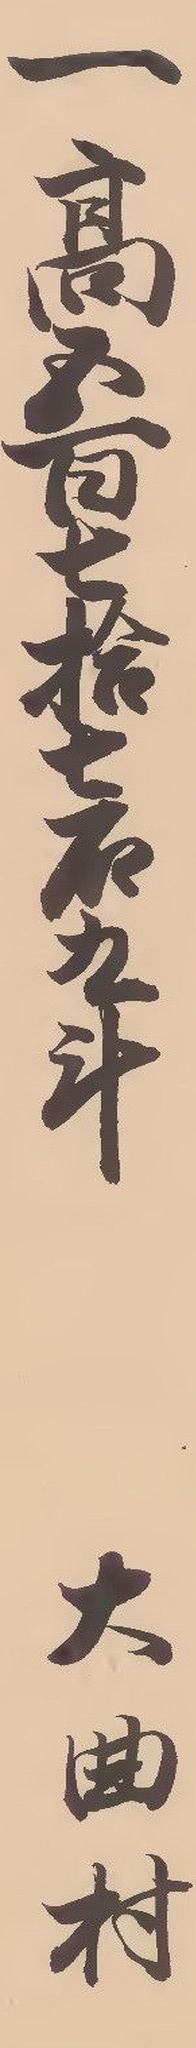一高五百七拾七石九斗大曲村

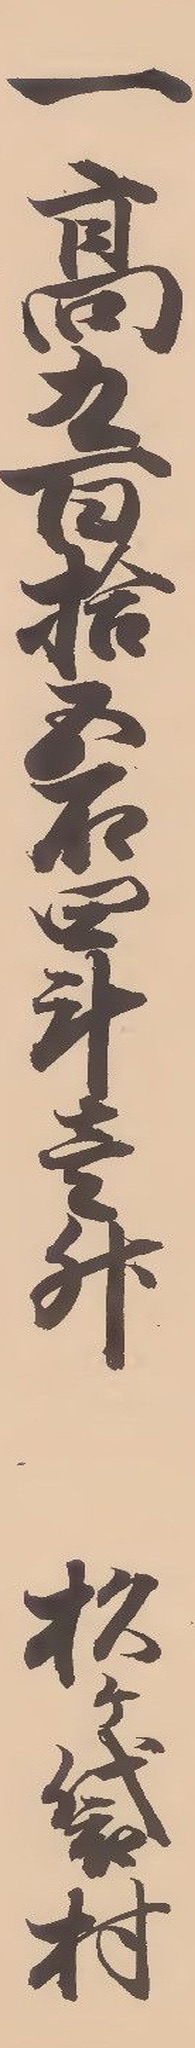一高九百拾五石四斗壱升杉ヶ袋村
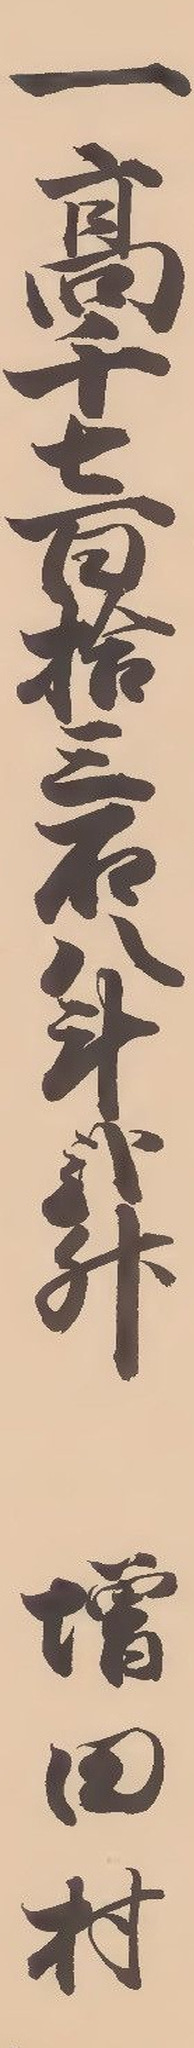一高千七百拾三石八斗弐升増田村
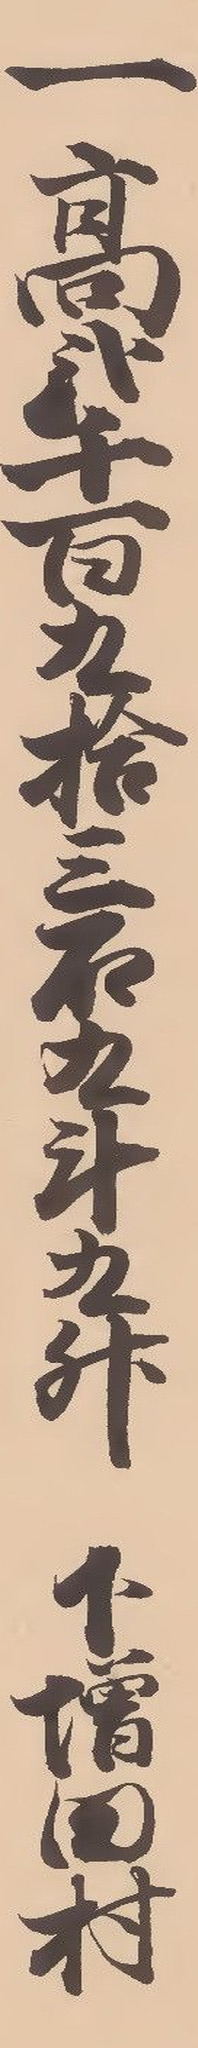一高弐千百九拾三石九斗九升下増田村
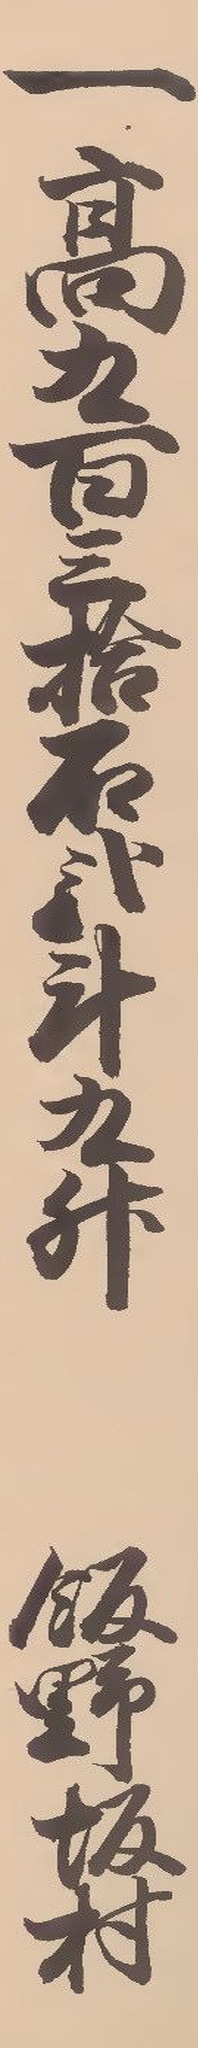一高九百三拾石弐斗九升飯野坂村
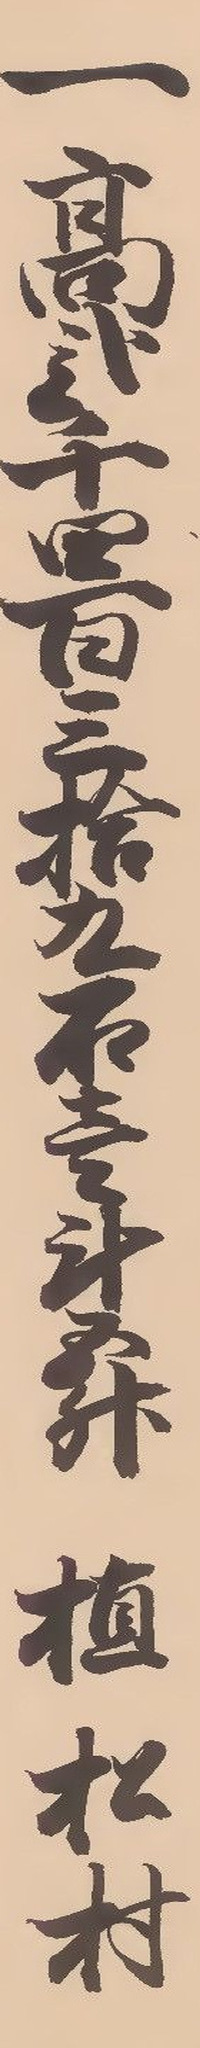一高弐千四百三拾九石壱斗五升植松村
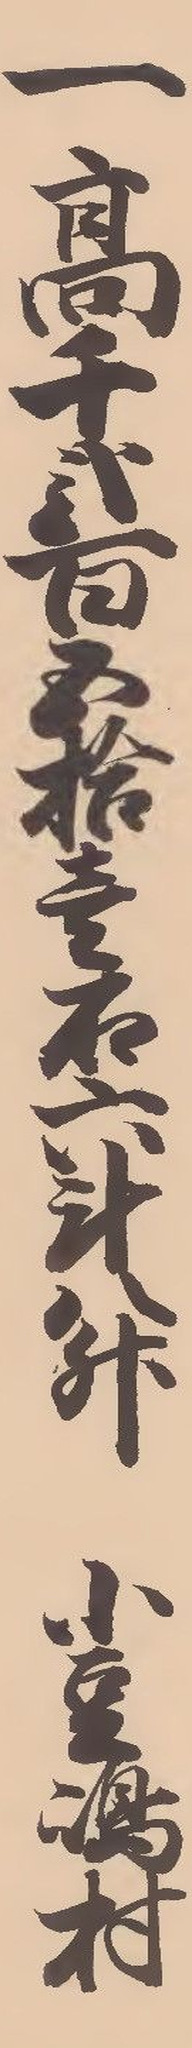一高千弐百五拾壱石六斗八升小豆島村
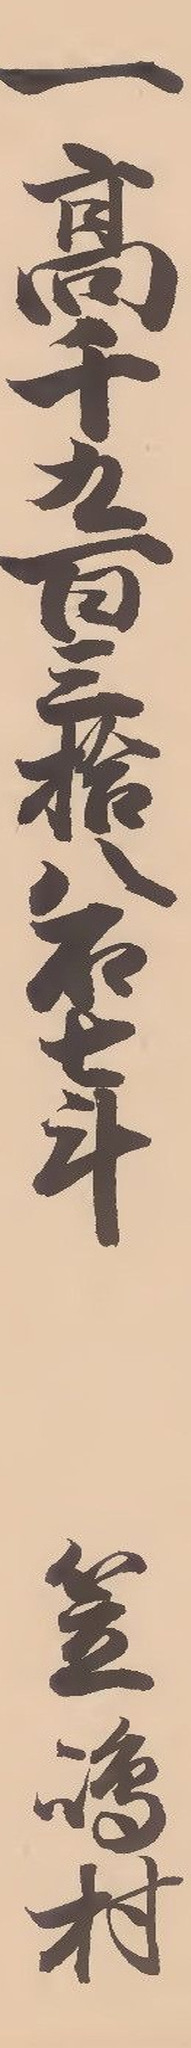一高千九百三拾八石七斗笠島村

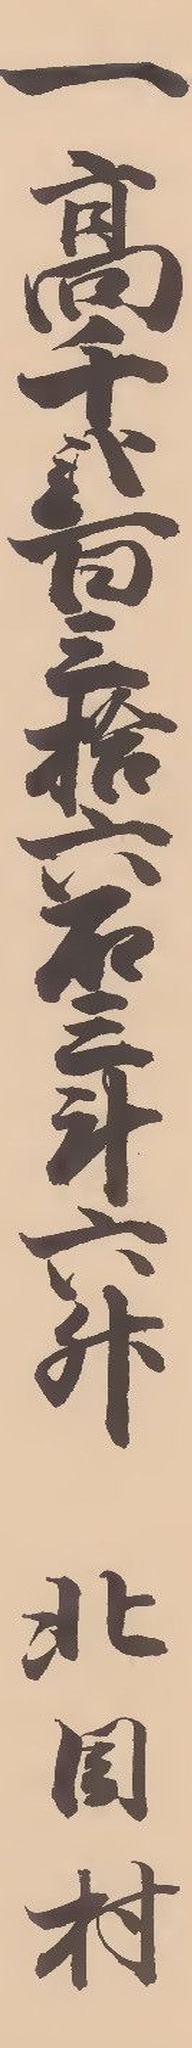一高千弐百三拾六石三斗六升北目村
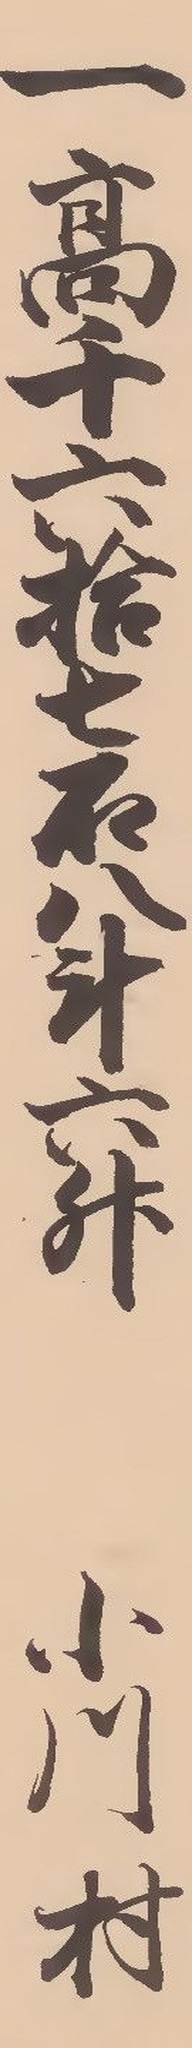一高千六拾七石八斗六升小川村
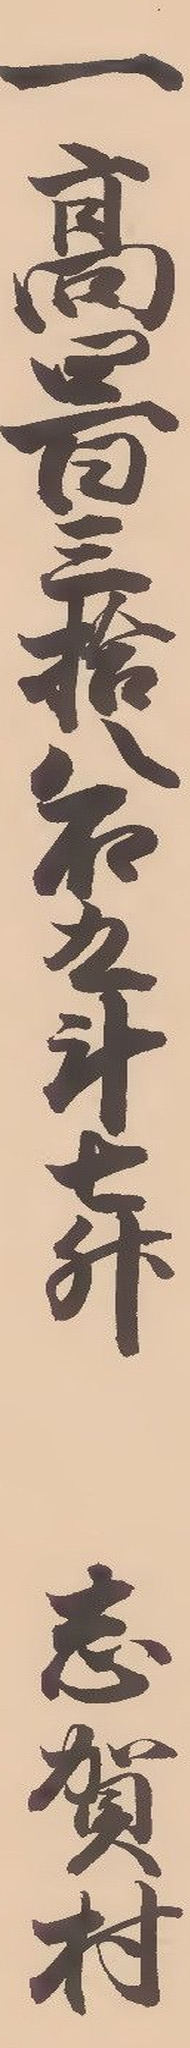一高四百三拾八石九斗七升志賀村
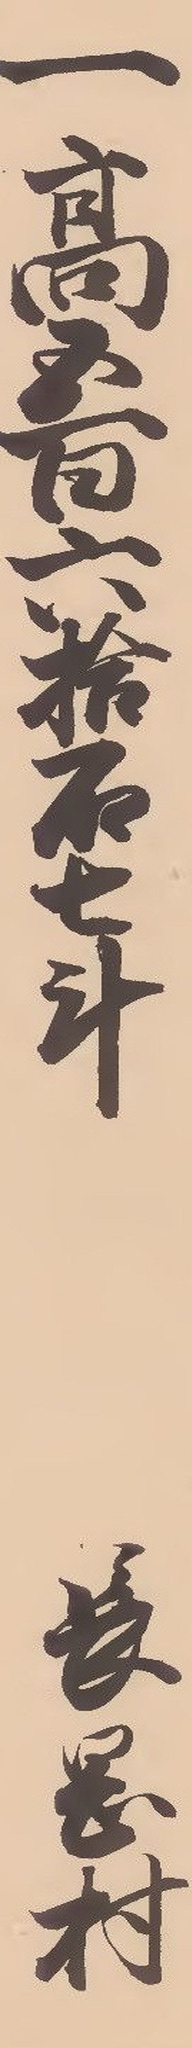一高五百六拾石七斗長岡村
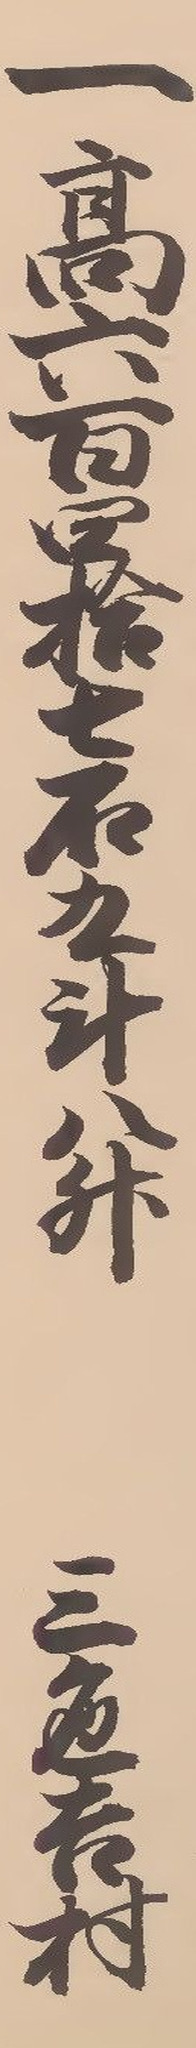一高六百四拾七石九斗八升三色吉村
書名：陸奥国郷帳　５
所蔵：国立公文書館 National Archives of Japan
